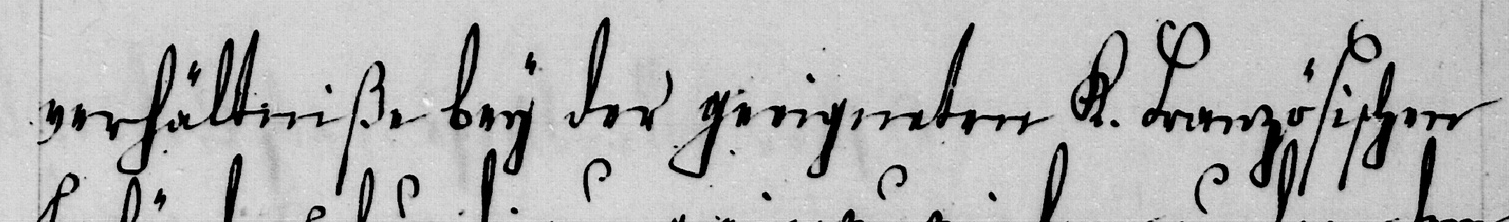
verhältniße bey der geeigneten K. Französischen
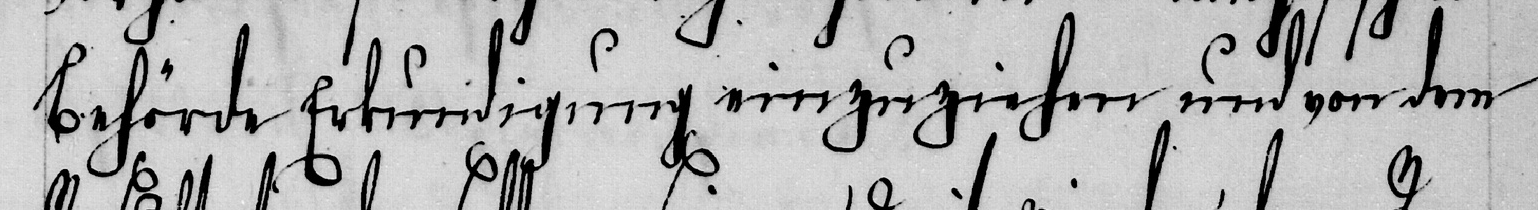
Behörde Erkundigung einzuziehen und von dem
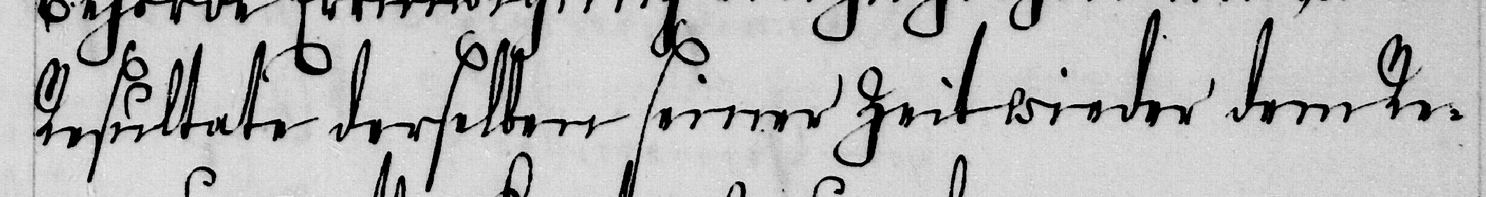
Resultate derselben seiner Zeit wieder dem Re¬
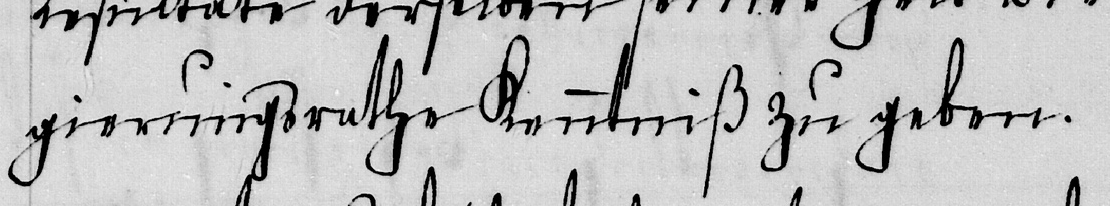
gierungsrathe Kenntniß zu geben.
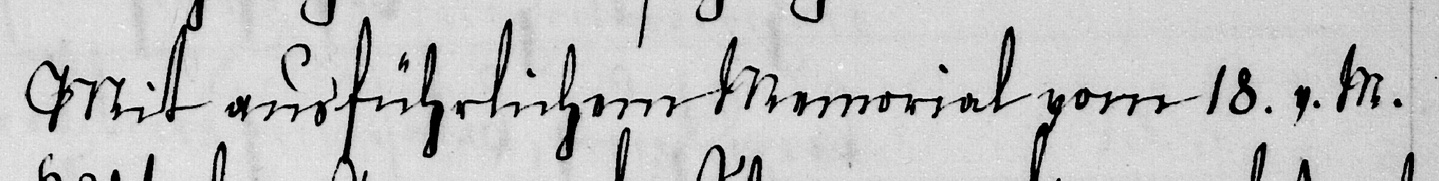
Mit ausführlichem Memorial vom 18. v. M.
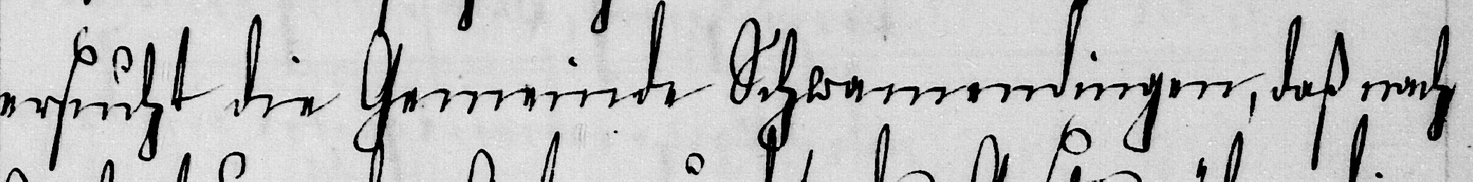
ersucht die Gemeinde Schwamendignen, daß nach
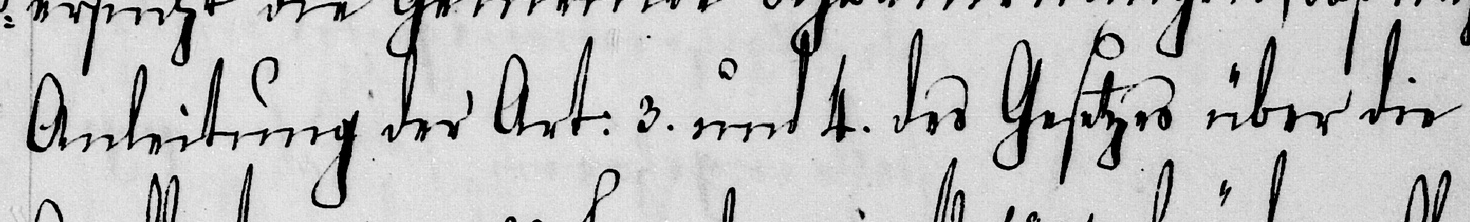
Anleitung der Art. 3. und 4. des Gesetzes über die
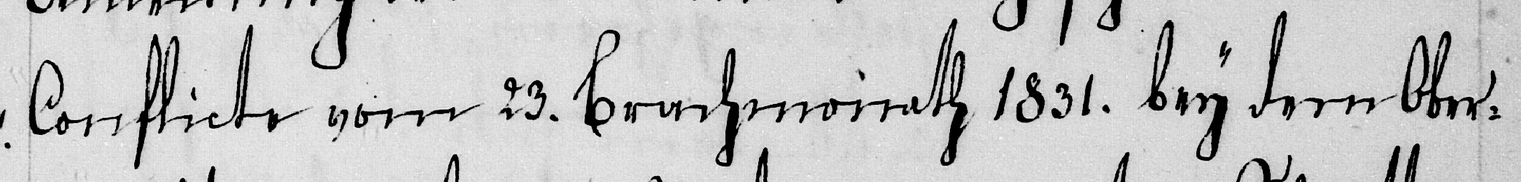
Conflicte vom 23. Brachmonath 1831. bey dem Ober¬
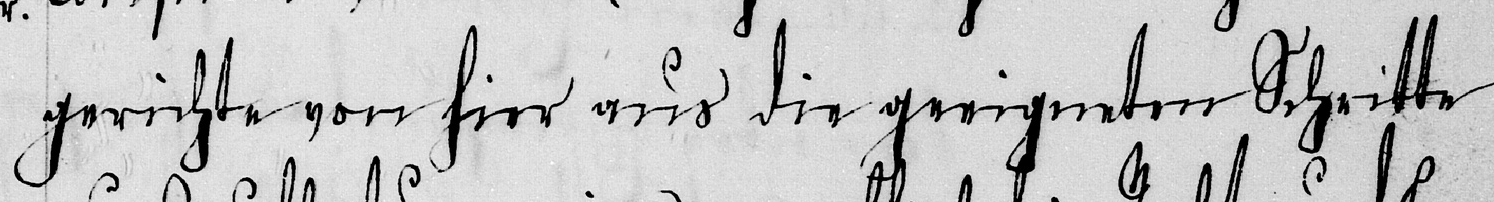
gerichte von hier aus die geeigneten Schritte
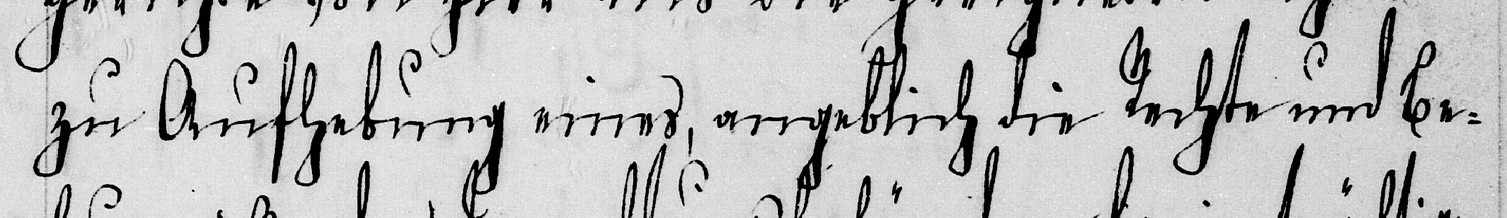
zu Aufhebung eines, angeblich die Rechte und Be¬
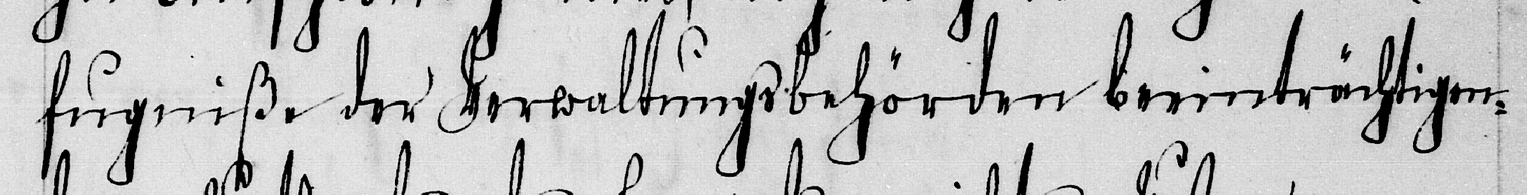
fugniße der Verwaltungsbehörden beeinträchtigen¬
